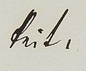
keit.
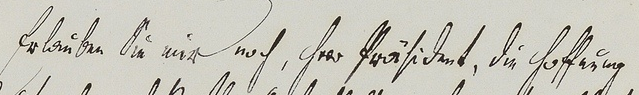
Erlauben Sie mir noch, Herr Präsident, die
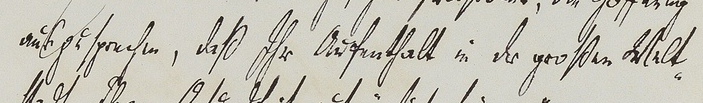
auszusprechen, daß Ihr Aufenthalt in der großen Welt-
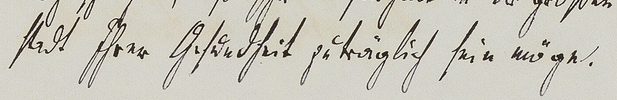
stadt Ihrer Gesundheit zuträglich sein möge.
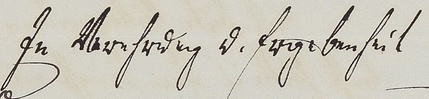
In Verehrung u. Ergebenheit
